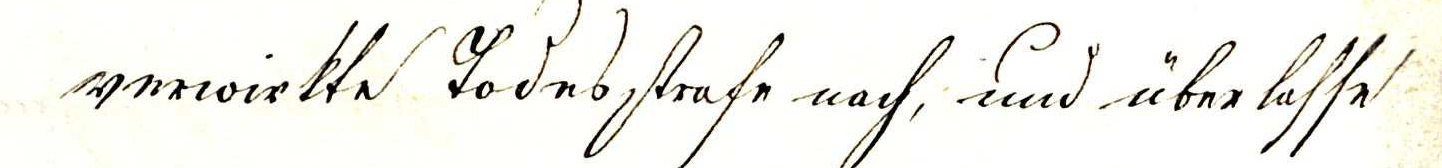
verwirkte Todesstrafe nach, und überlasse
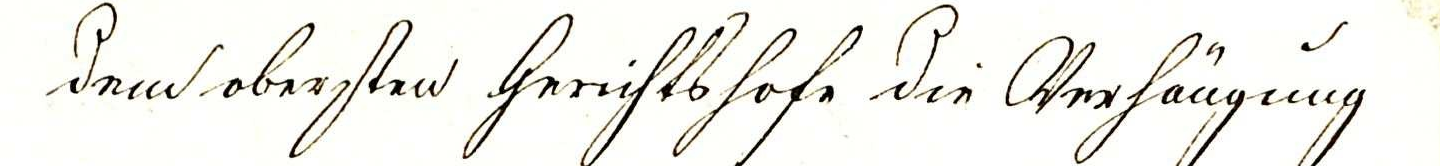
dem obersten Gerichtshofe die Verhängung
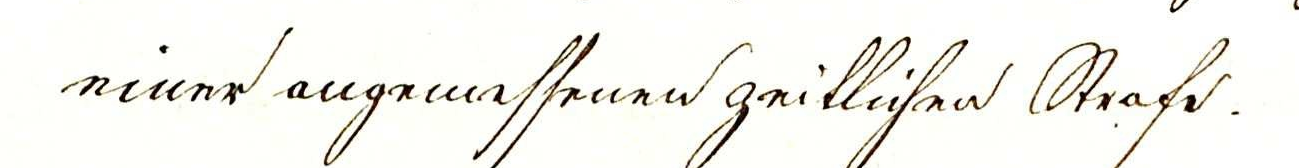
einer angemessenen zeitlichen Strafe.
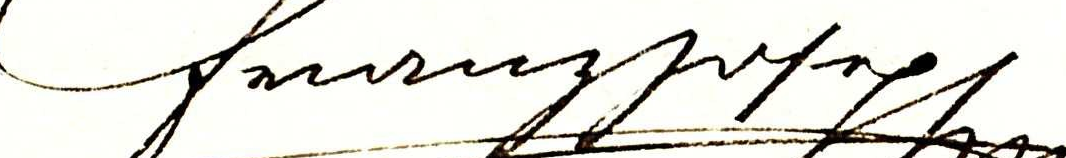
Franz Joseph
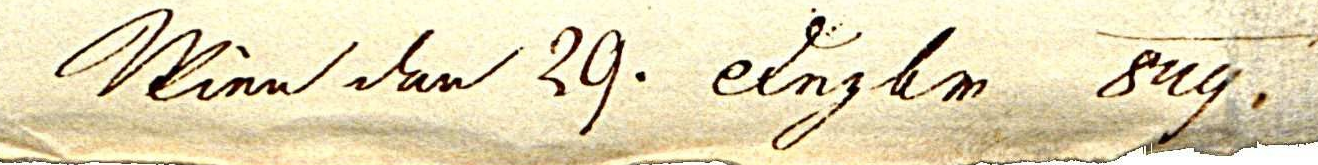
Wien den 29. Dezbr 849.
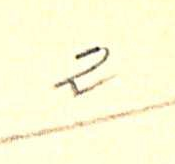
2
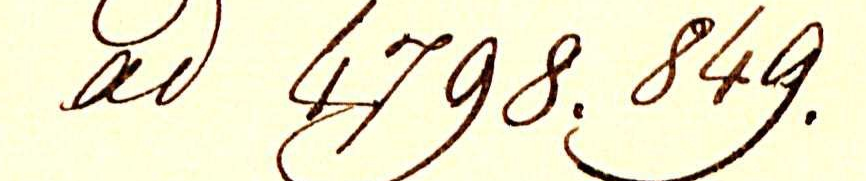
ad 4798. 849.
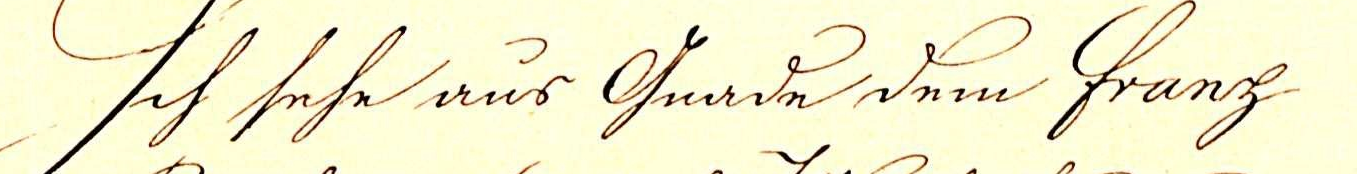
Ich sehe aus Gnade dem Franz
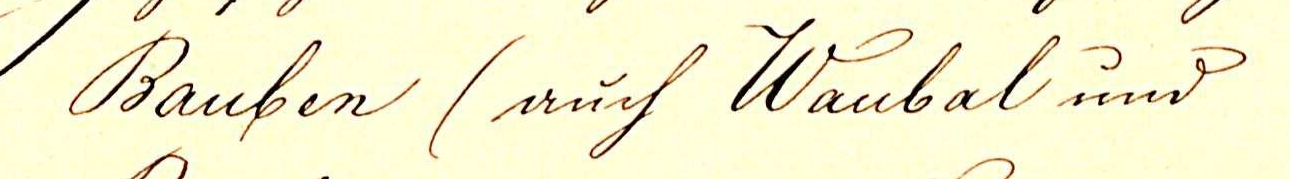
Bauben (auch Waubal und
